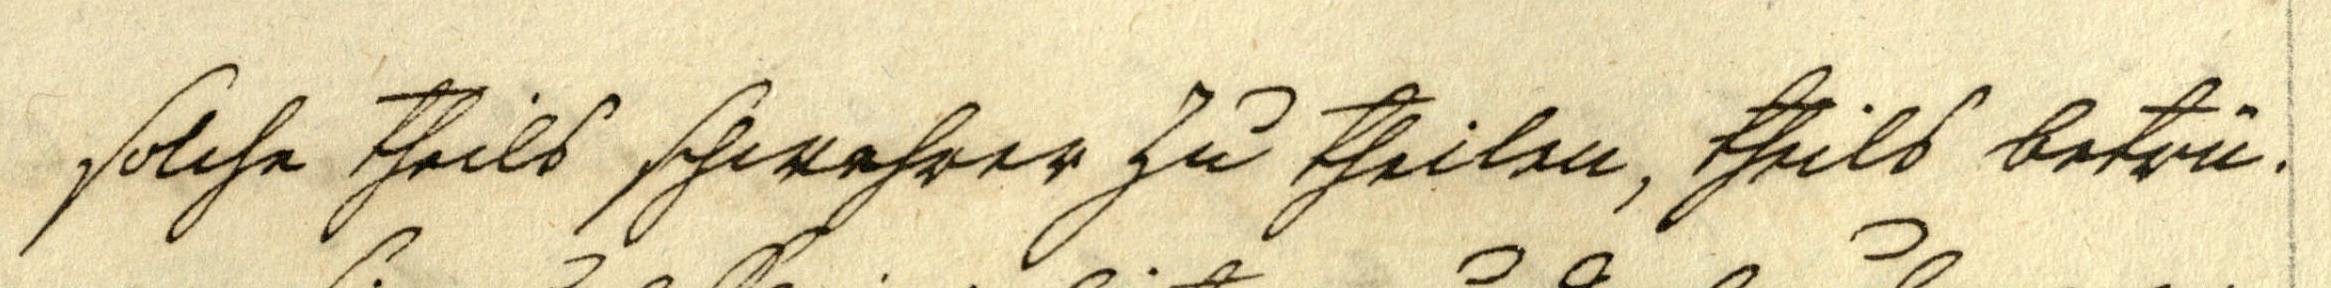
solche theils schwehrer zu theilen, theils betrü¬
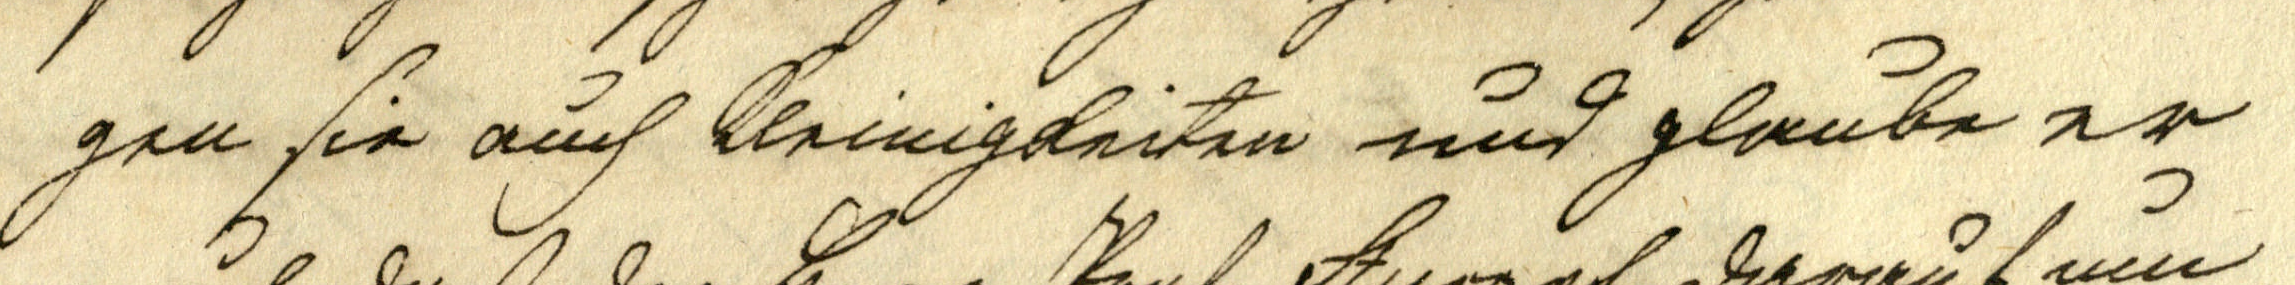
gen sie auch Kleinigkeiten und glaube er
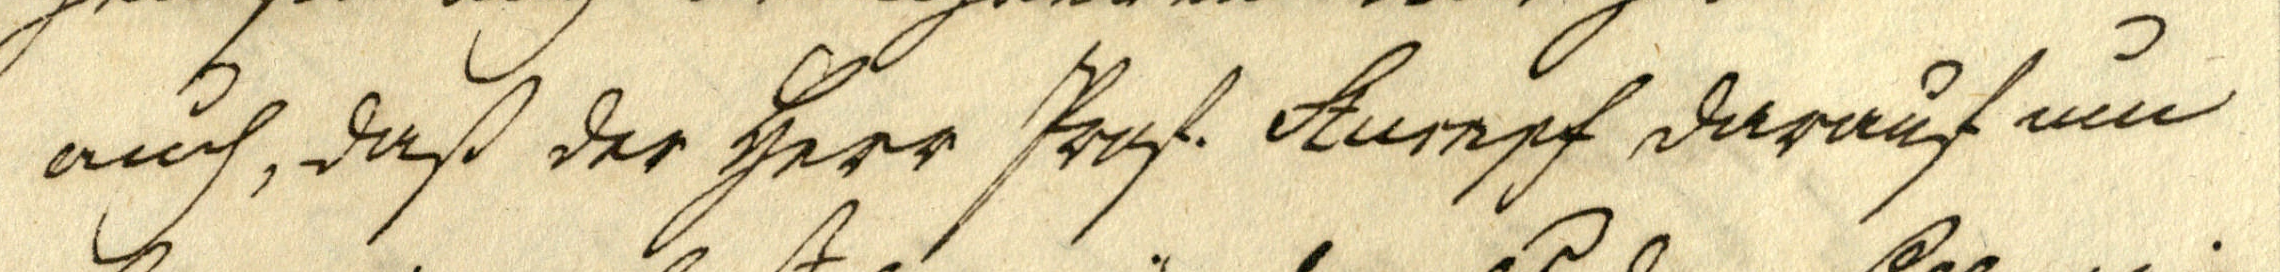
auch, daß der Herr Prof. Stumpf darauf um
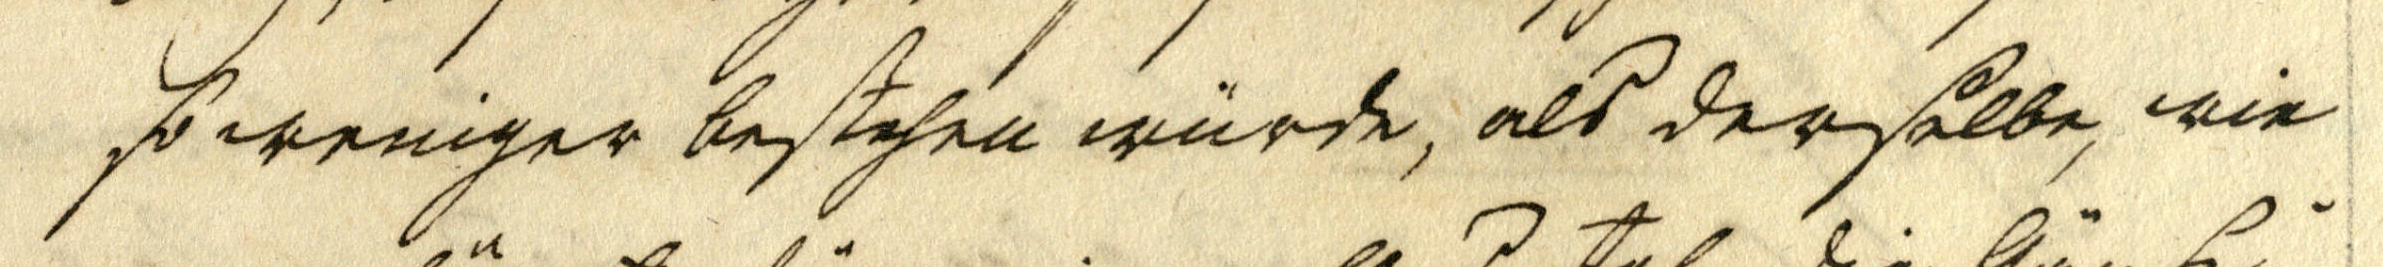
so weniger bestehen würde, als derselbe, wie
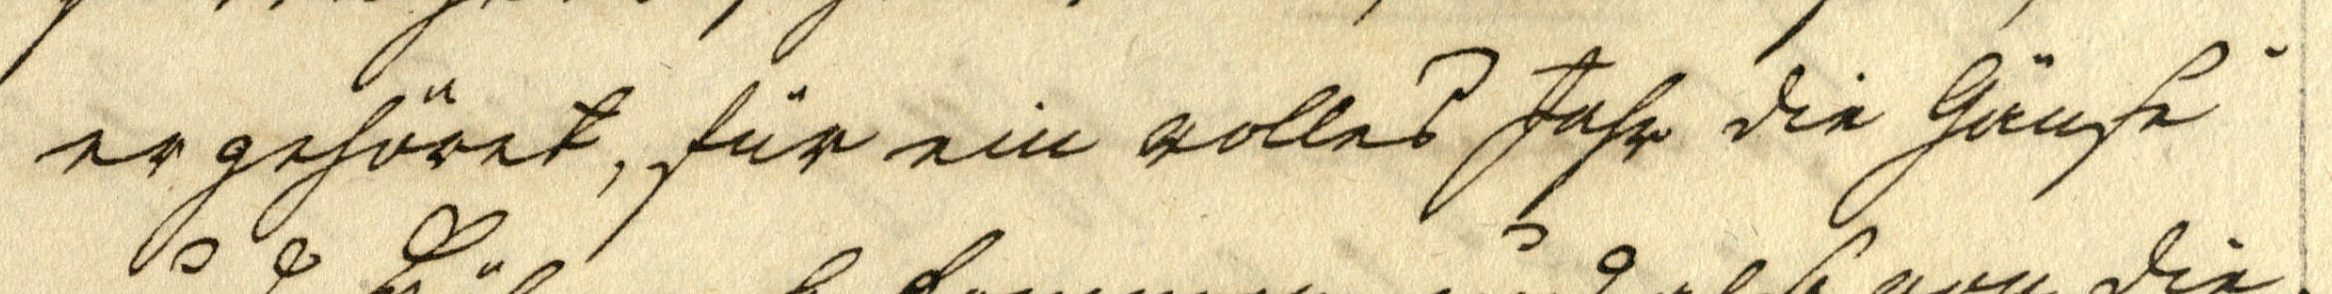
er gehöret, für ein volles Jahr die Gänse
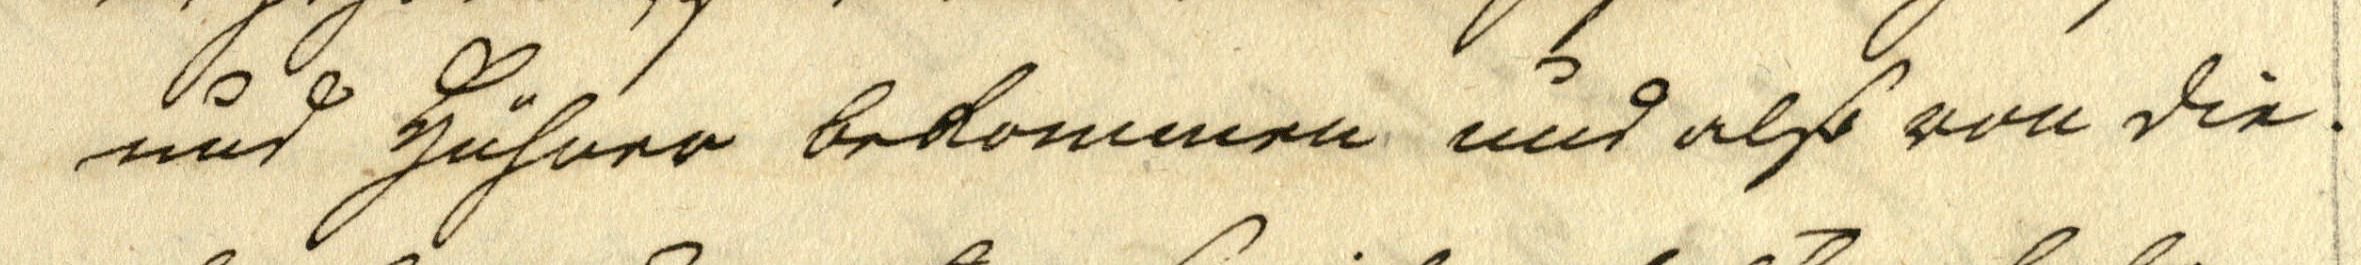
und Hühner bekommen und also von die¬
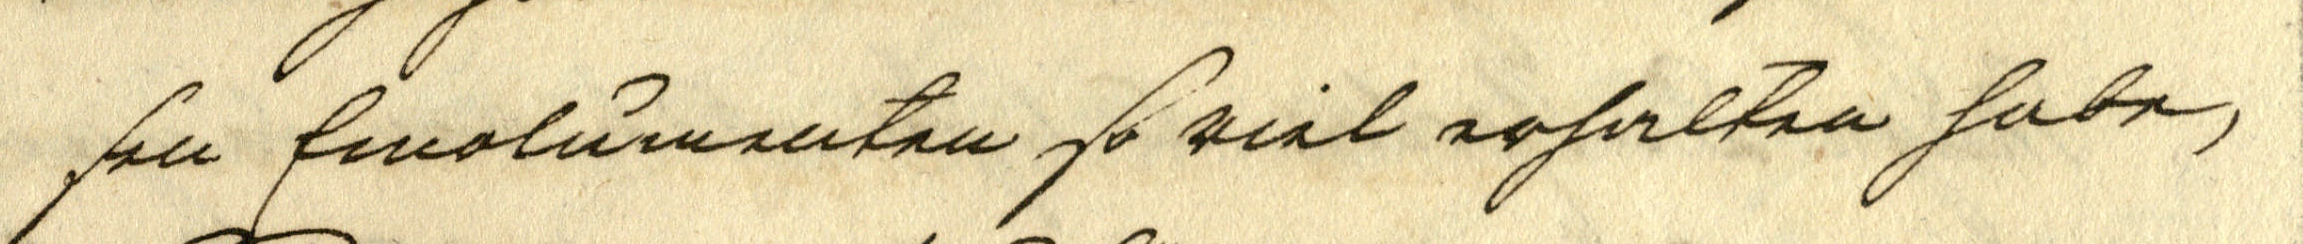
sen Emolumenten so viel erhalten habe,
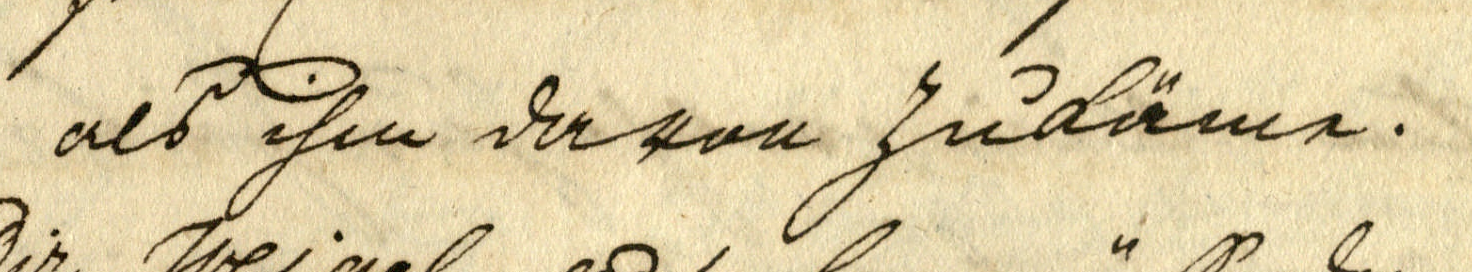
als ihm davon zukäme.
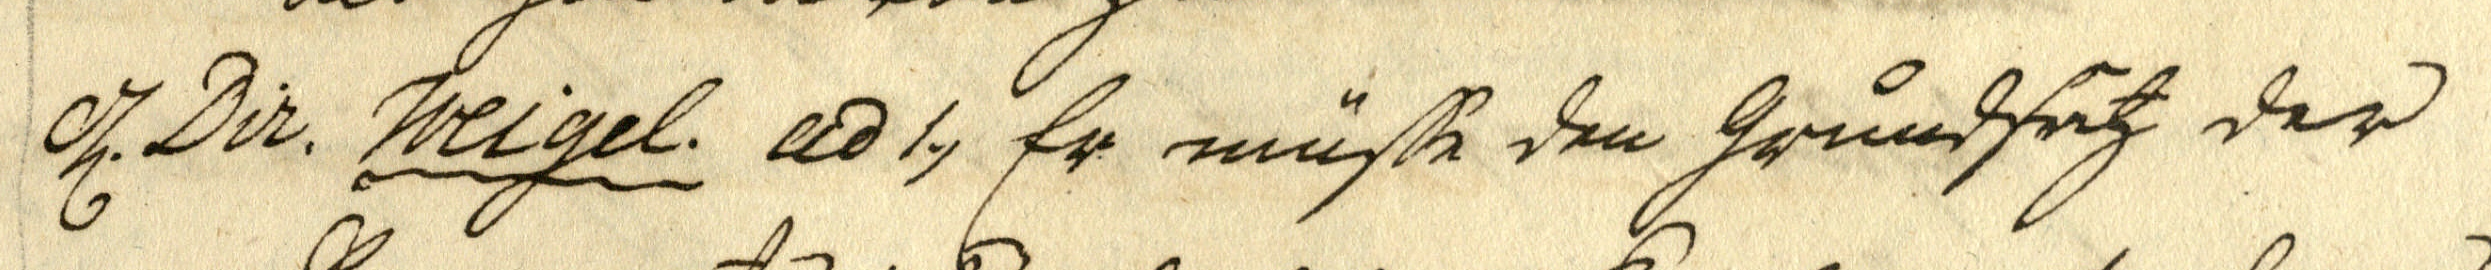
dh. Dir. Weigel. ad 1., Er müsse den Grundsatz der
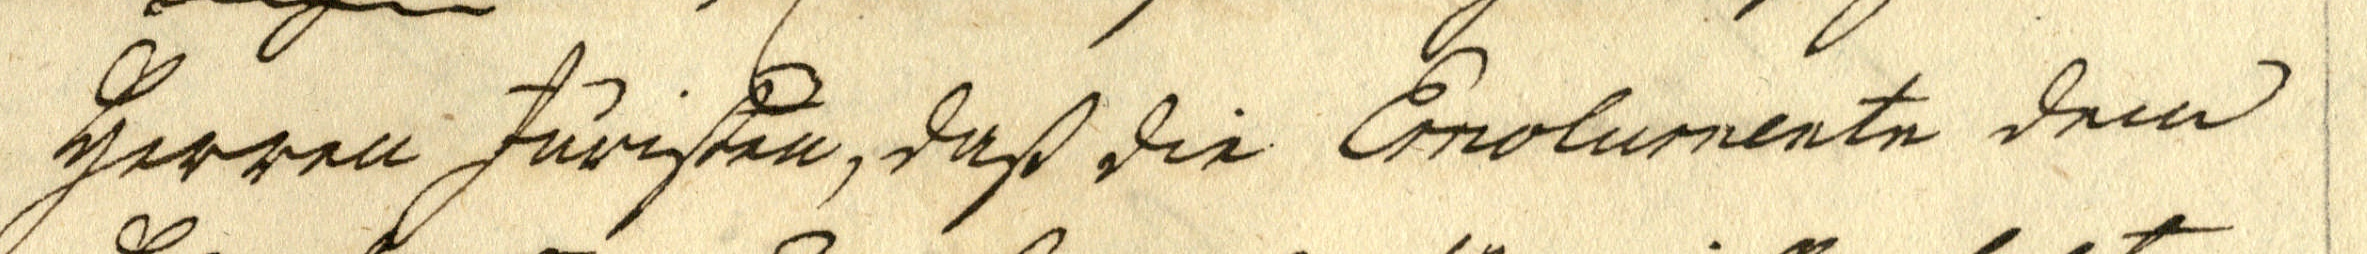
Herren Juristen, daß die Emolumente dem
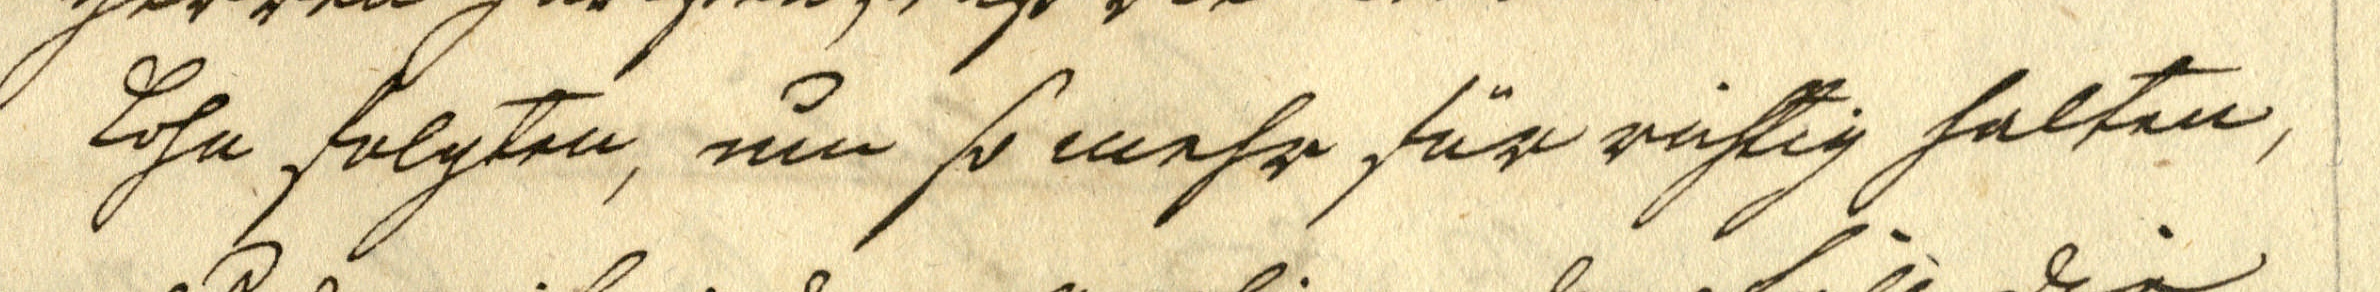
Lohn folgten, um so mehr für richtig halten,
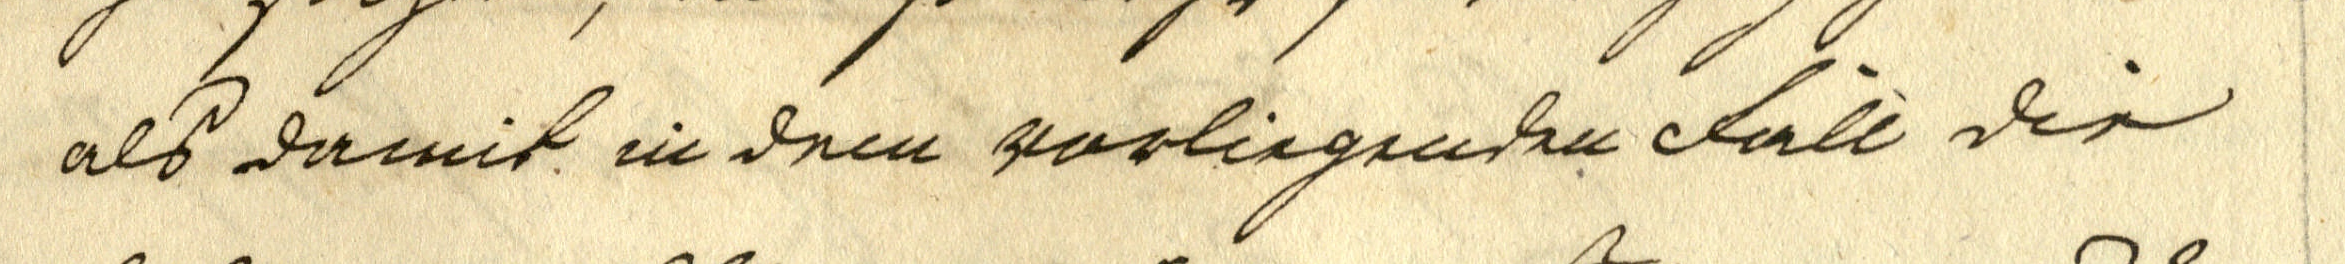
als damit in dem vorliegenden Fall die
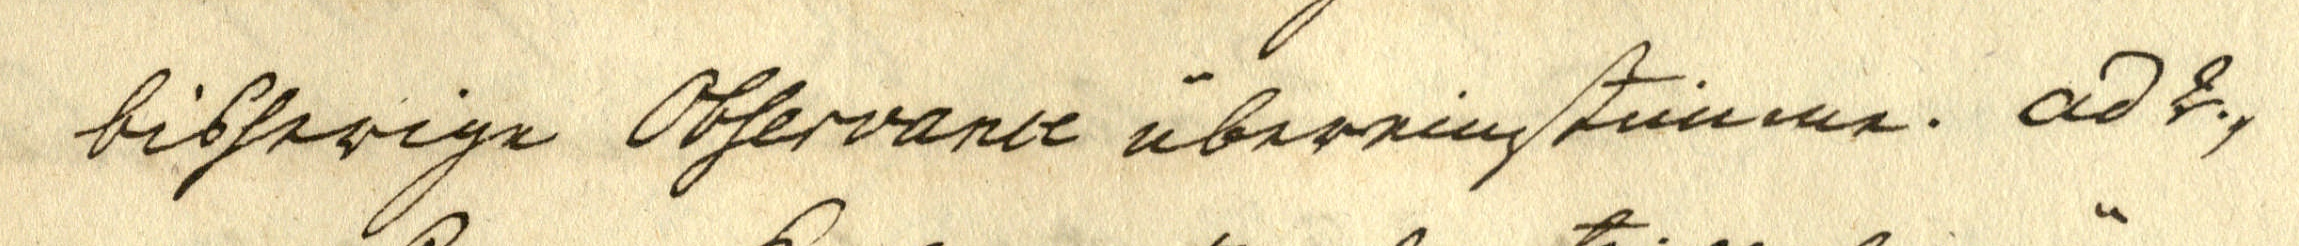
bisherige Observance übereinstimme. ad 2.,
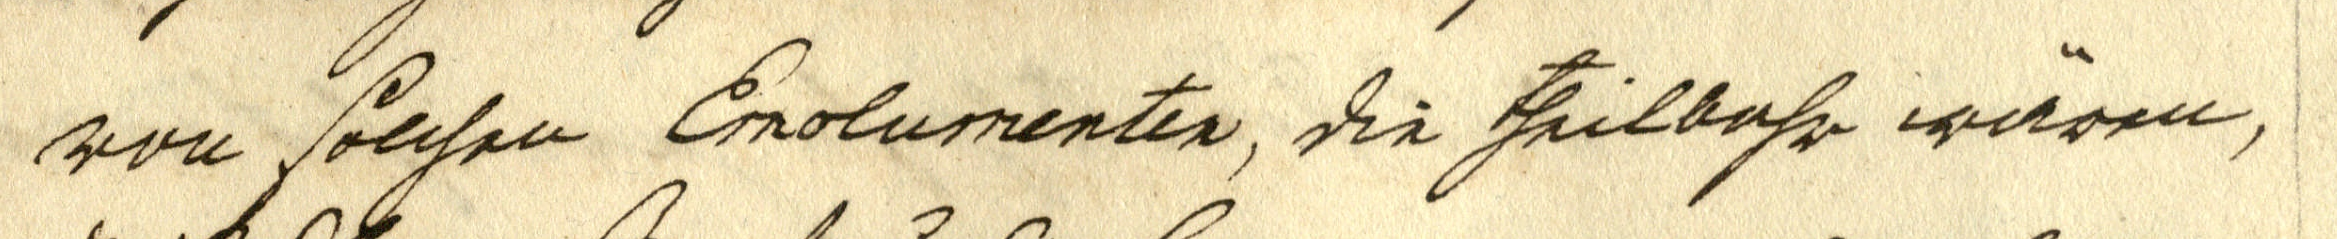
von solchen Emolumenten, die theilbahr wären,
